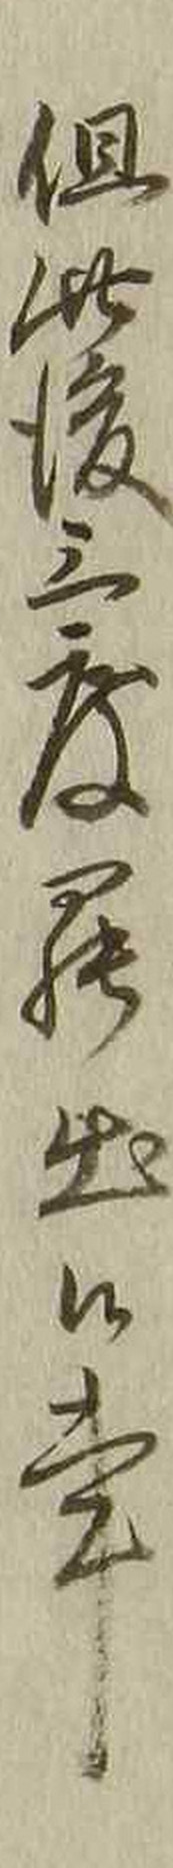但此後三度罷出候事
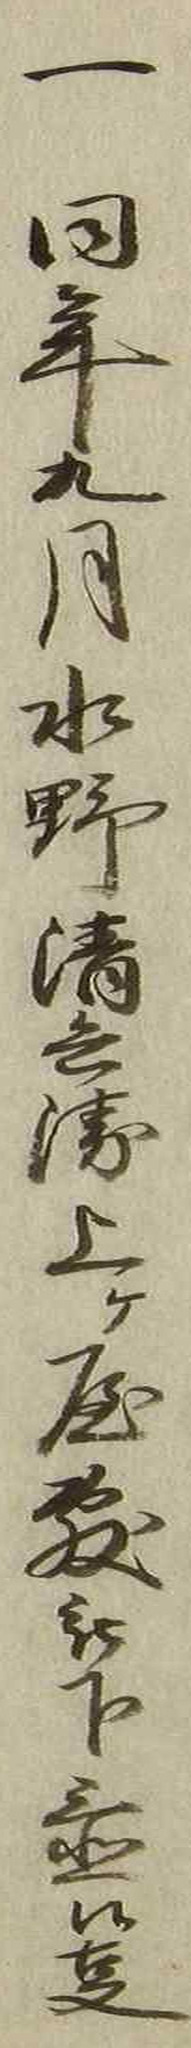一同年九月水野清兵衛上ケ屋敷被下置候事
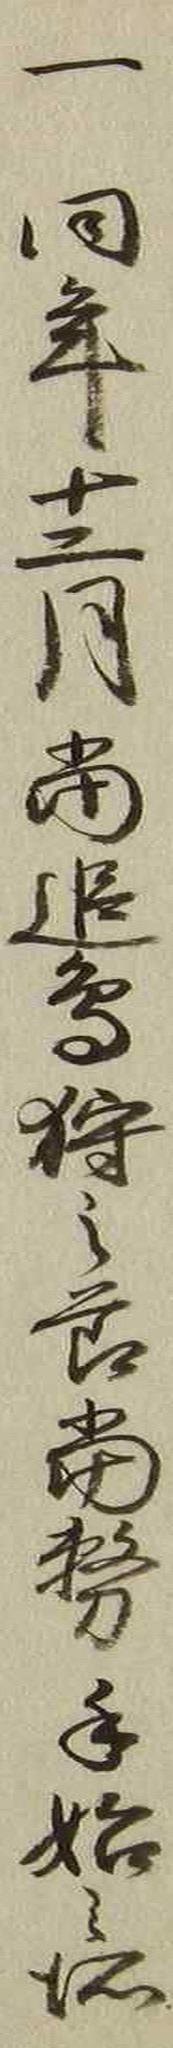一同年十二月当追鳥狩之節当務手始之所
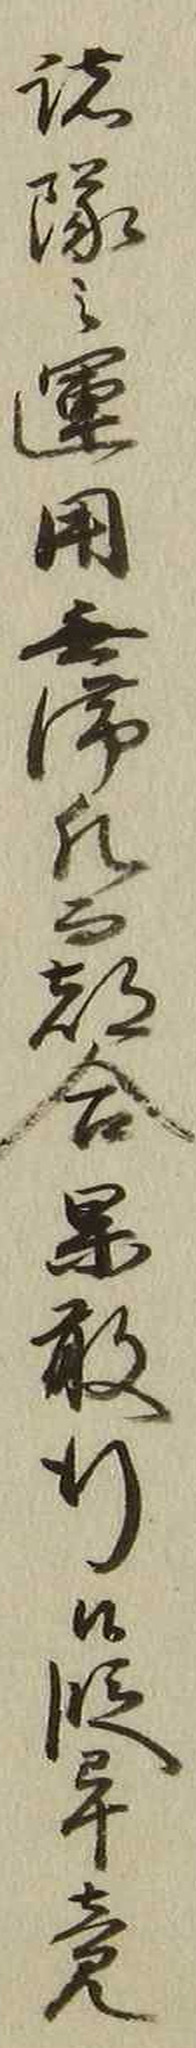諸隊之運用無滞凡而都合果敢行候段畢竟
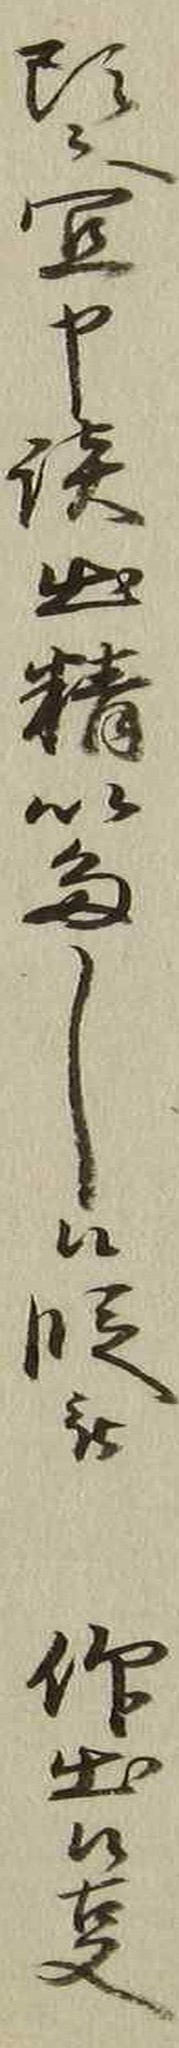頭々へ宜申談出精いたし候段被仰出候事
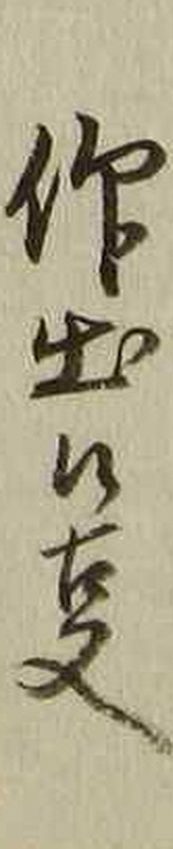仰出候事
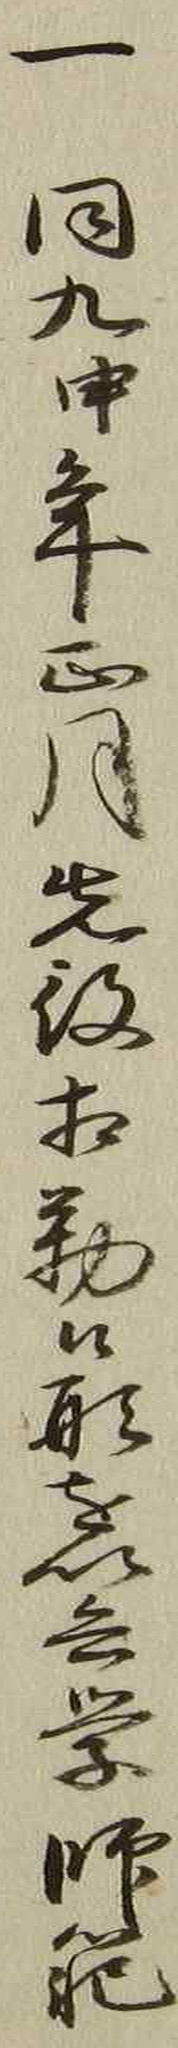一同九申年正月先役相勤候形を以兵学師範
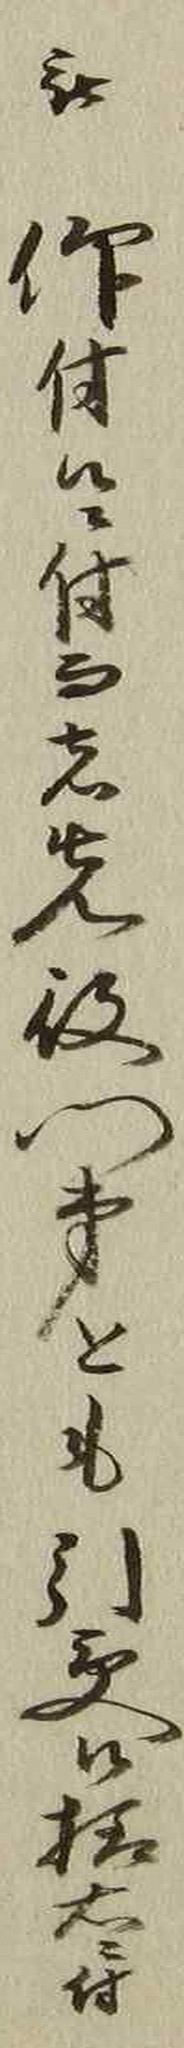被仰付候に付而は先役門弟とも引受候様右に付
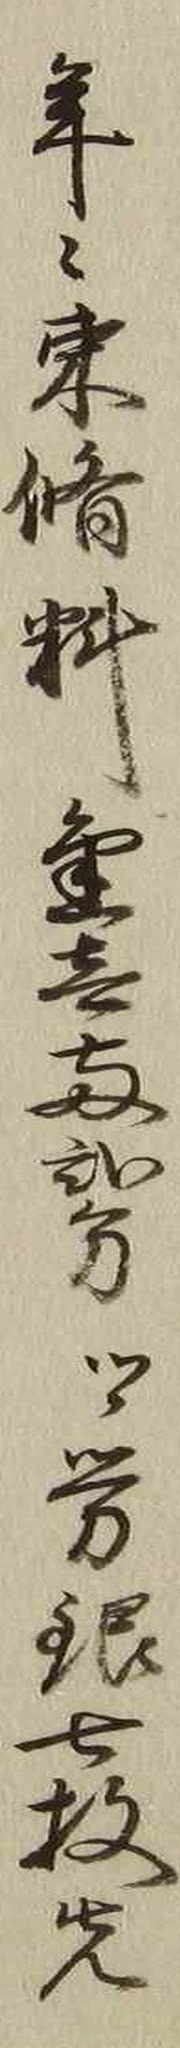年々束脩料金壱両弐分つヽ労銀七枚先
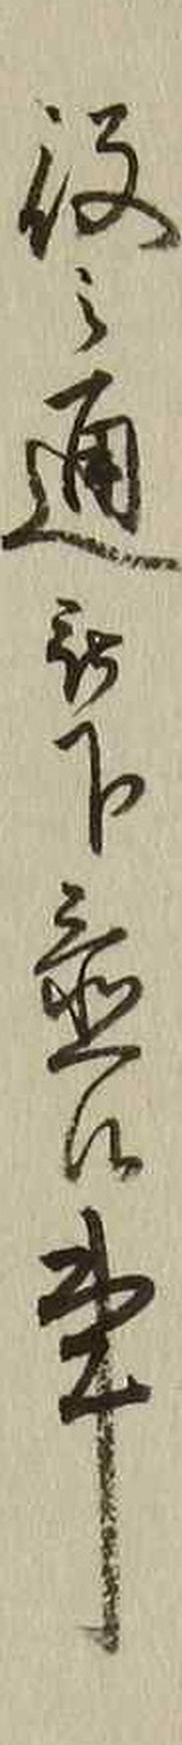役之通被下置候事
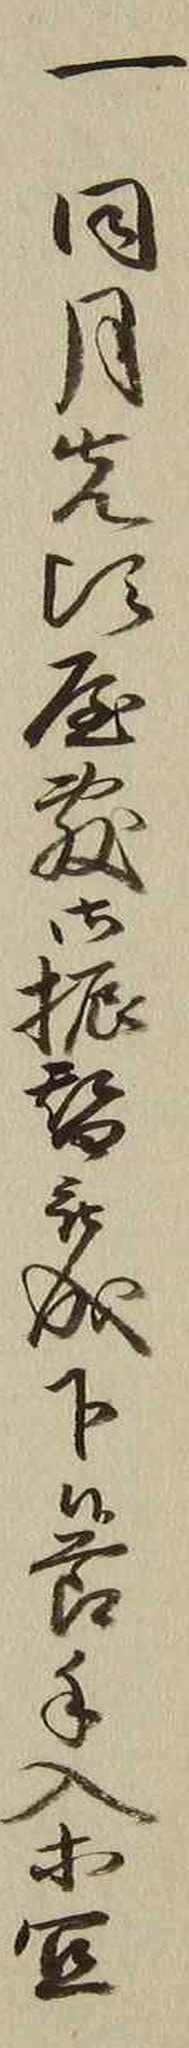一同月先頃屋敷御振替被成下候節手入等宜
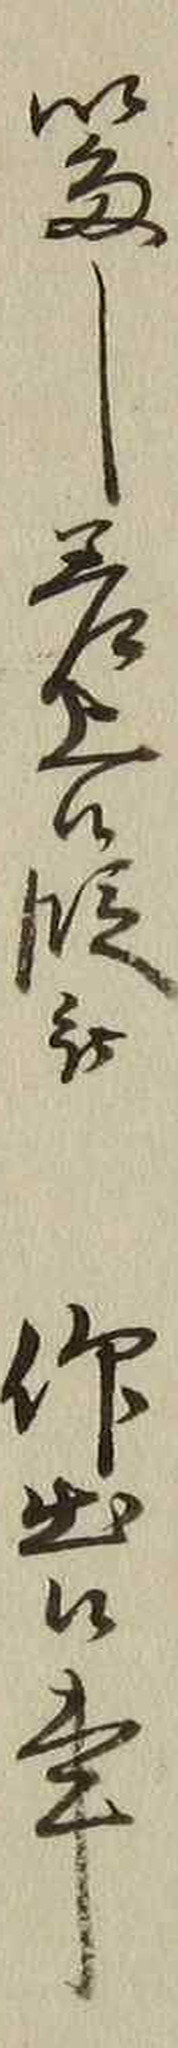いたし差上候段被仰出候事
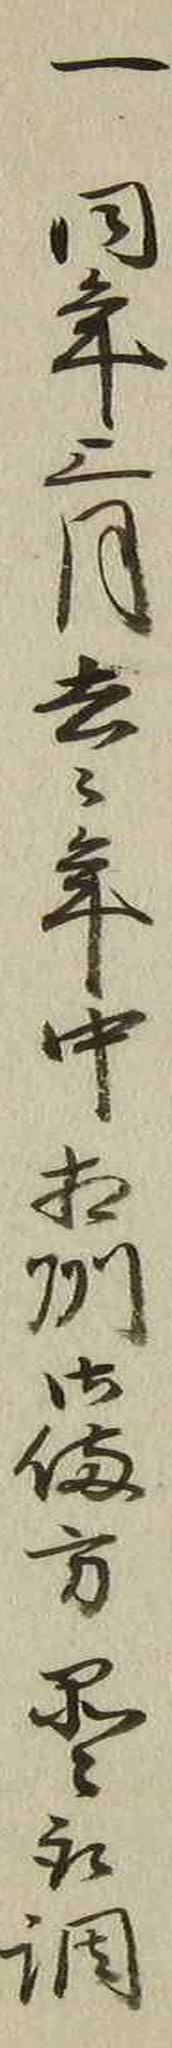一同年三月去々年中相州御備方品々取調
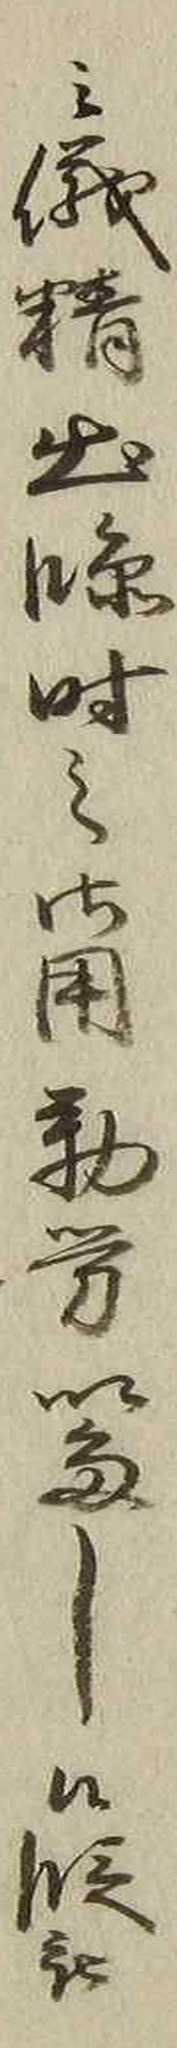之儀精出臨時之御用勤労いたし候段被
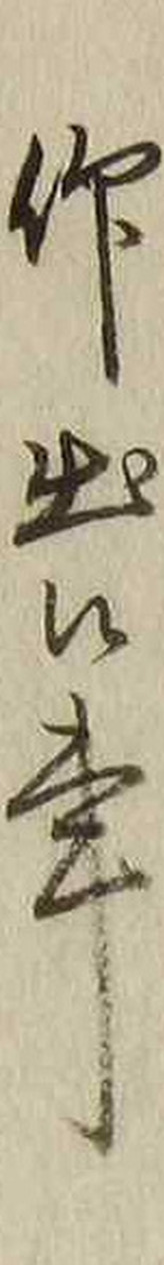仰出候事
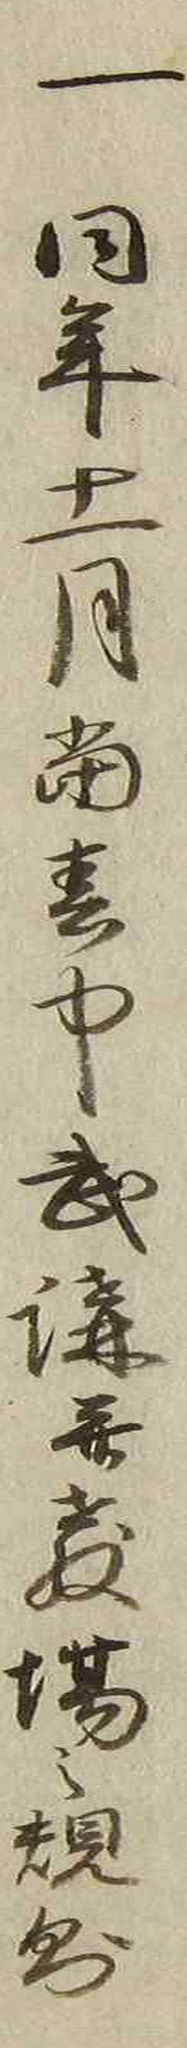一同年十一月当春中武講并教場之規則
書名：諸士系譜　巻之133　た之部9
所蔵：会津若松市立会津図書館
